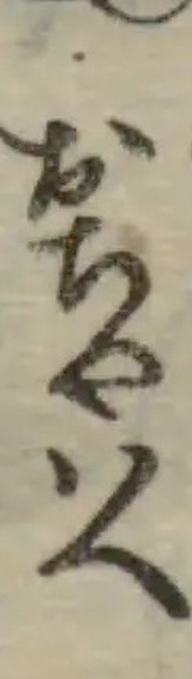おちやいへ
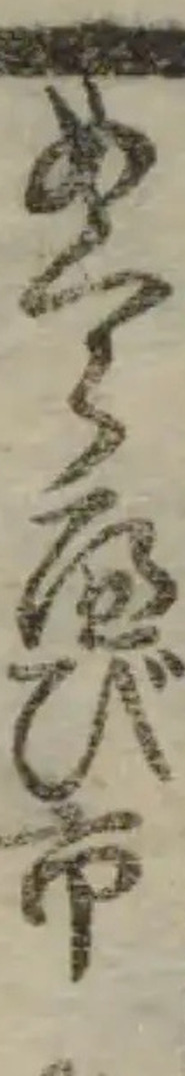めくらへび市
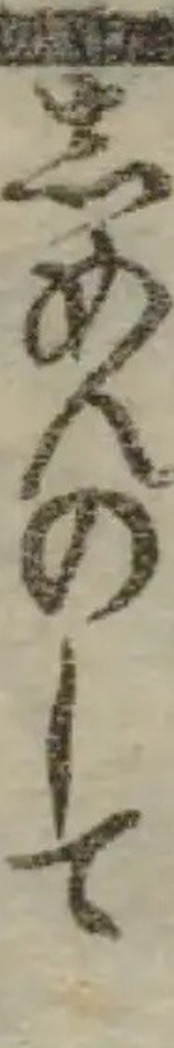しめんのして
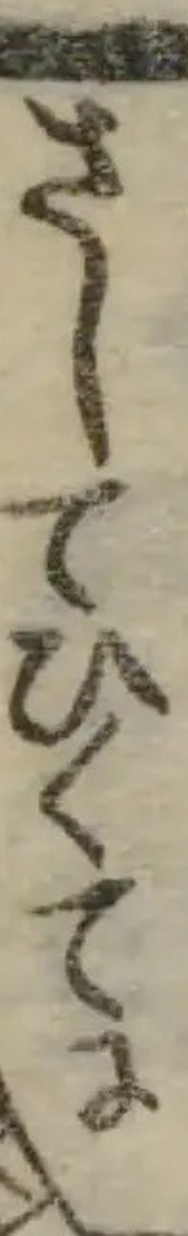さしてひくてに
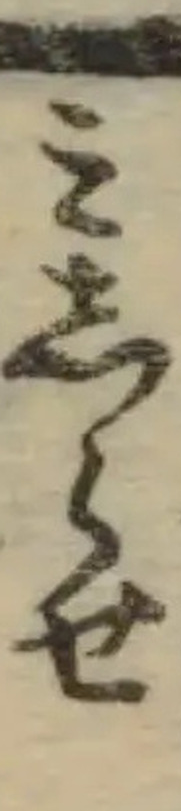みしらせ
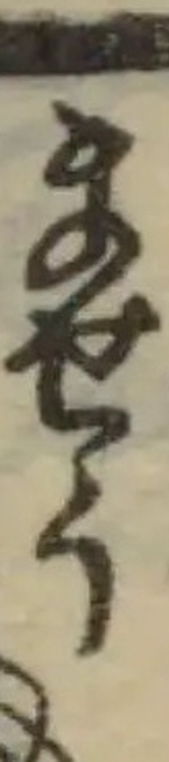ませう
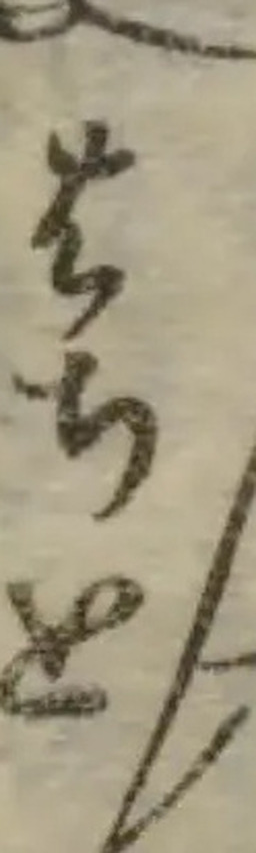はちと
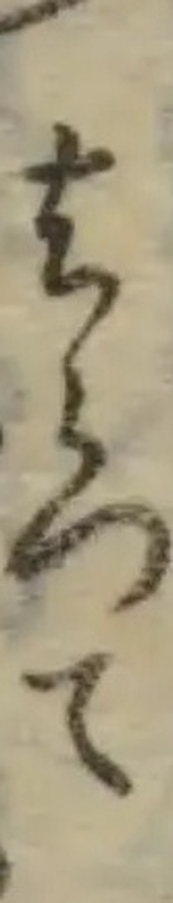はらつて
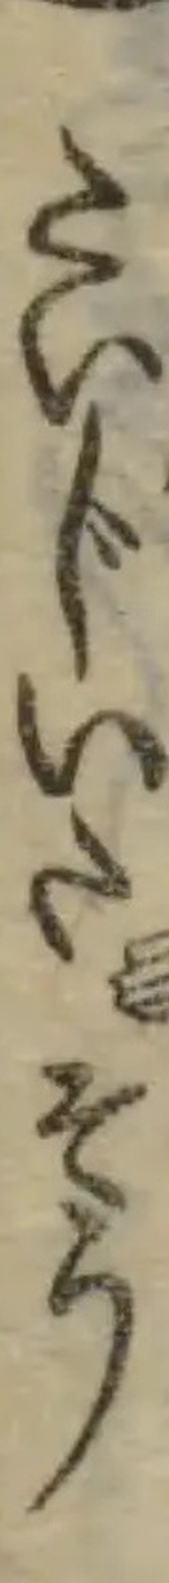たいじいたそう
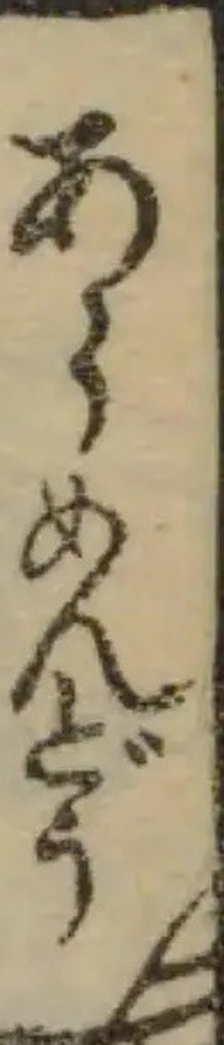あらめんどう
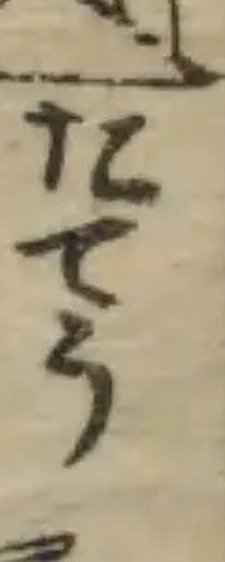たてう
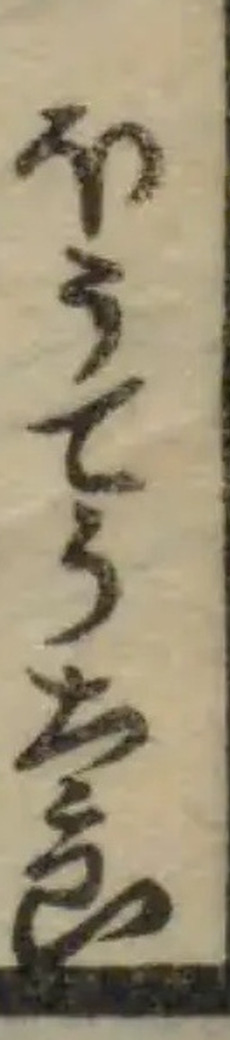ほうてう太郎
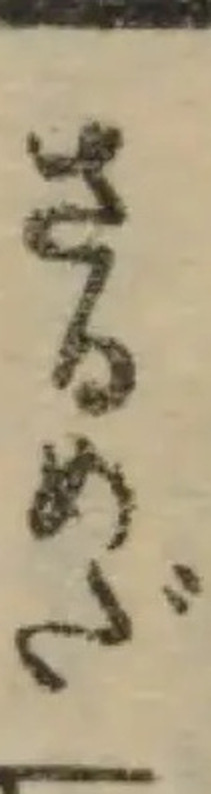さるめだ
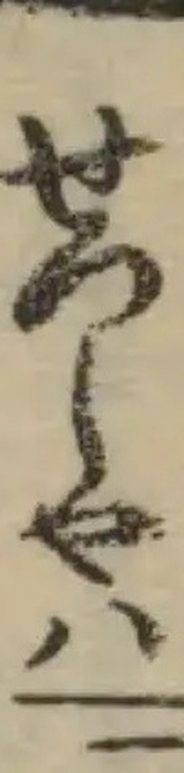せつしやは
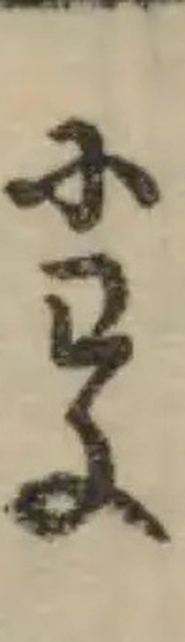にわに
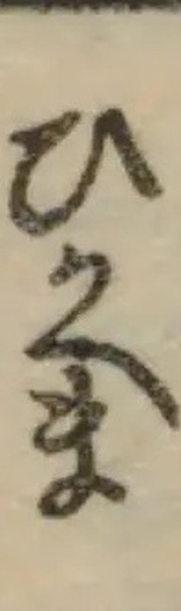ひかへま
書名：さるかに合戦
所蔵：国立国会図書館 National Diet Library, JAPAN
